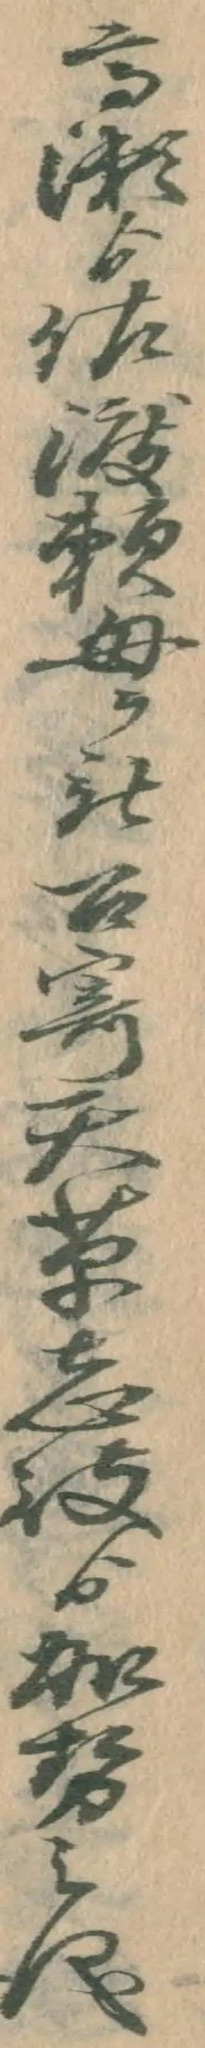高瀬ゟ佐渡頼母ヲ被召寄天草志岐ゟ加勢之儀
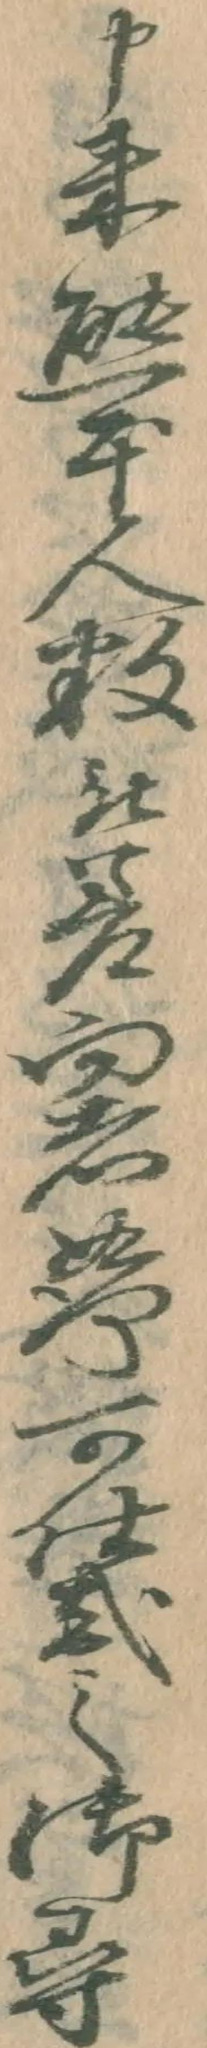申来熊本人数被差向者如何可仕哉之御尋

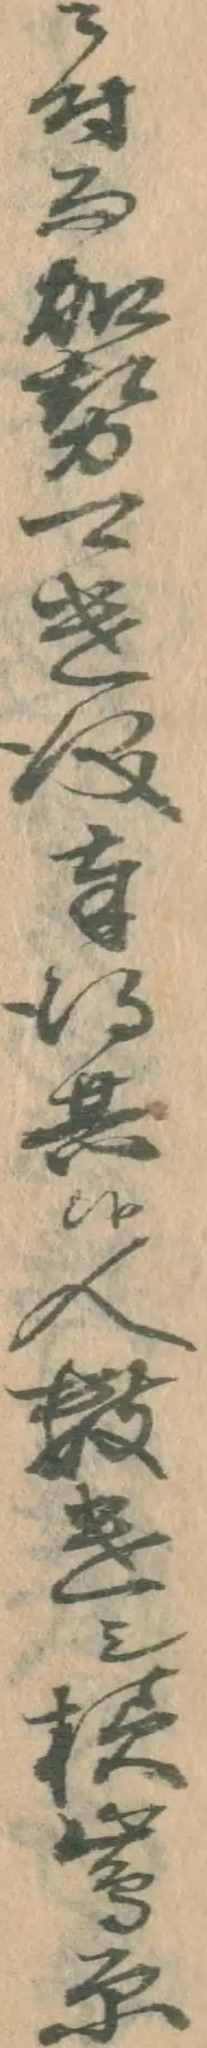に付而加勢可遣儀奉得共候人数遣シ様島原
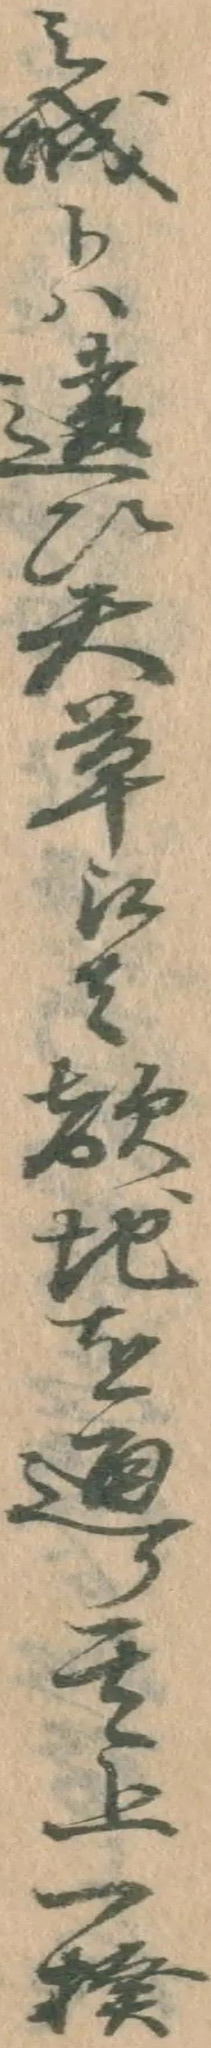之城とは違ひ天草江は敵地を通り其上一揆
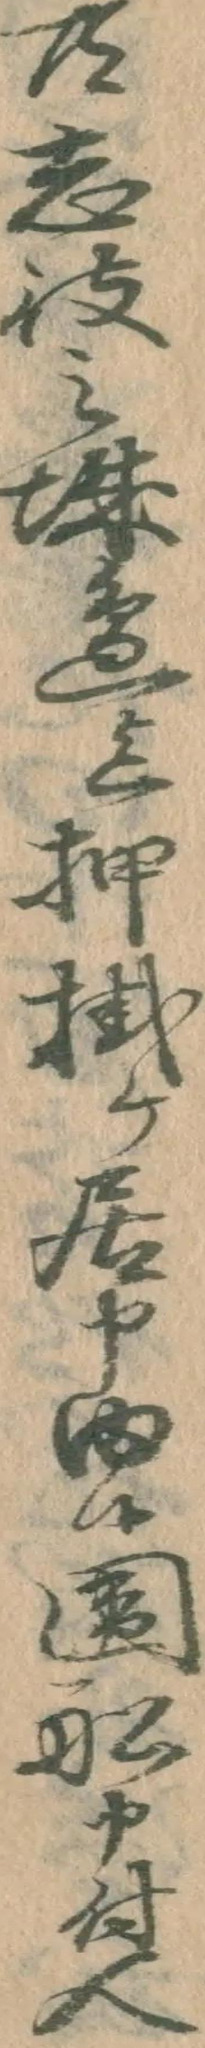共志岐之城辺迄押掛ヶ居申由候囲船申付人
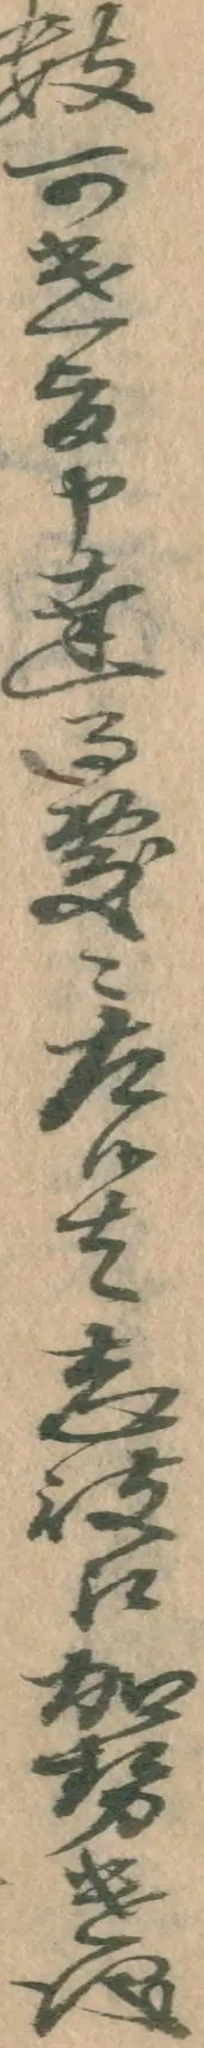数可遣旨申達る処に左候は志岐江加勢遣儀
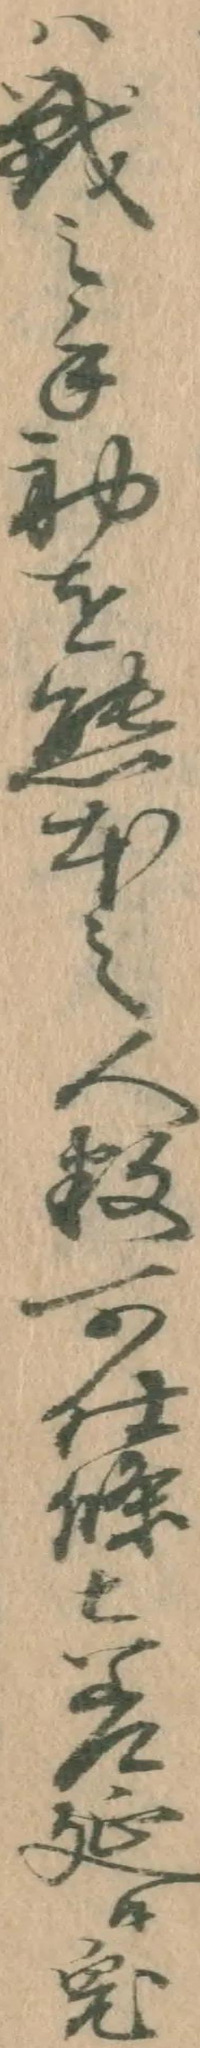は戦之手初を熊本之人数可仕条と差延候兎
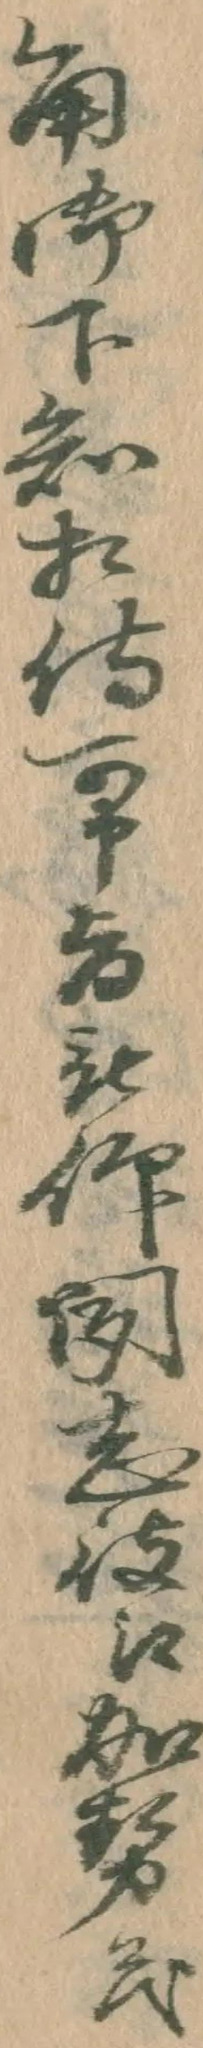角御下知相侍可申旨被仰聞志岐江加勢も
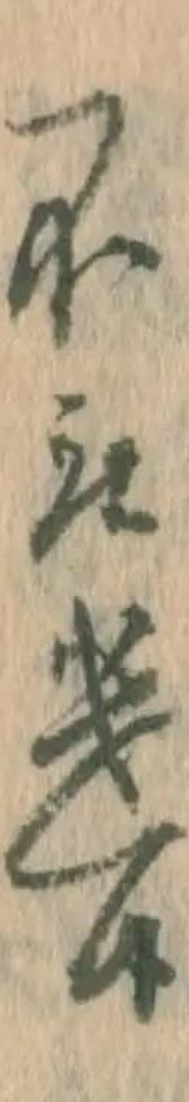不被遣候
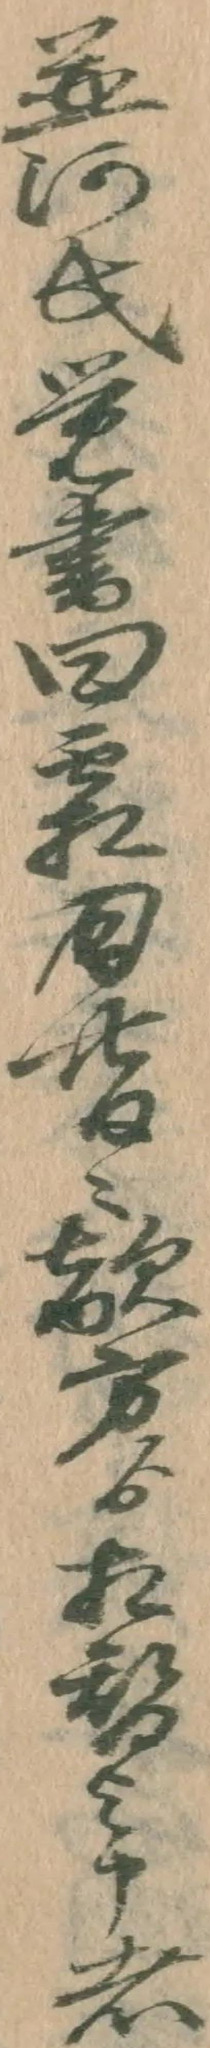並河氏覚書曰霜月廿日に敵方ゟ相替と申者
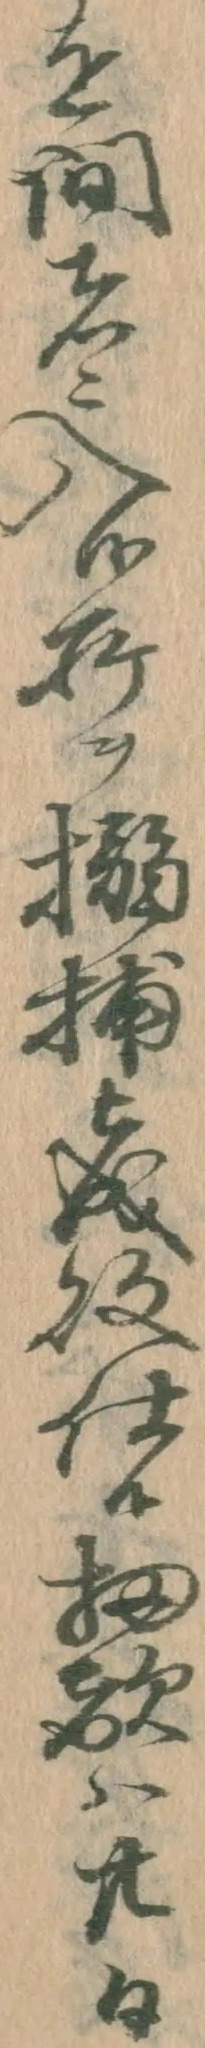を間者に入候所ヲ搦捕被成敗仕候扨敵は廿日
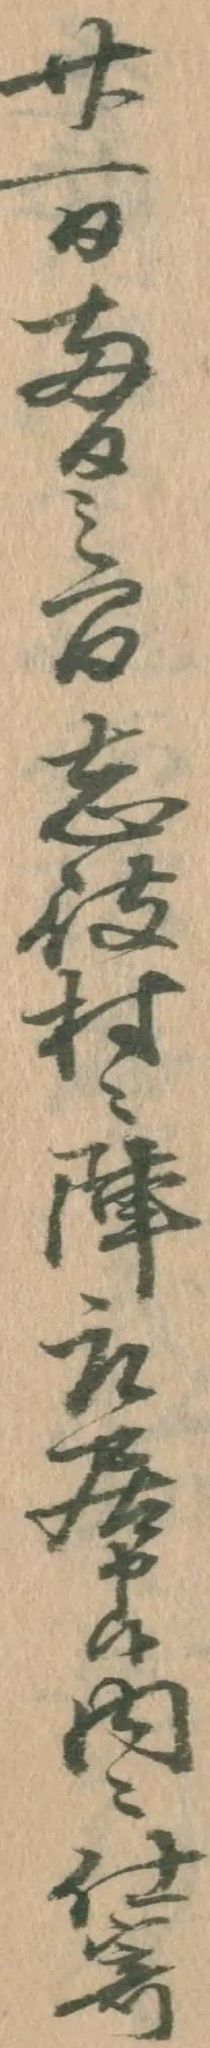廿一日両日之間志岐村に陣取居申候内に仕寄
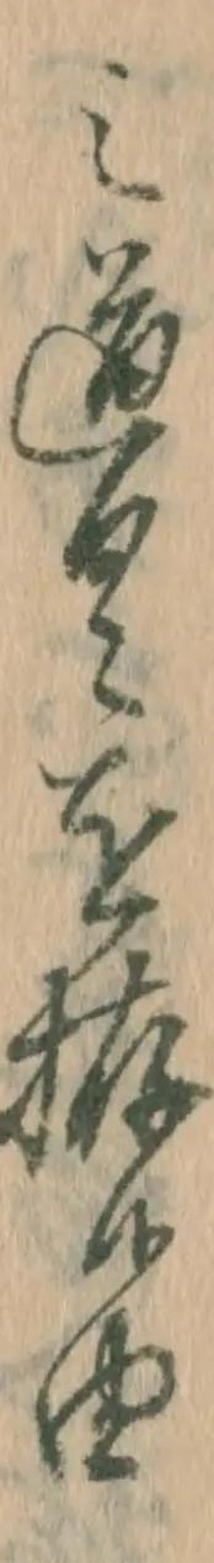之道具を拵候由
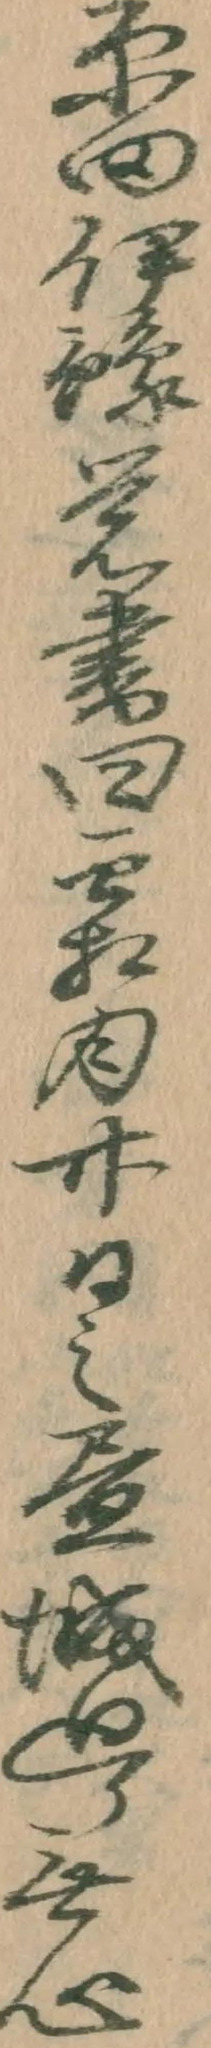原田伊予覚書曰霜月廿日之昼城廻り無心
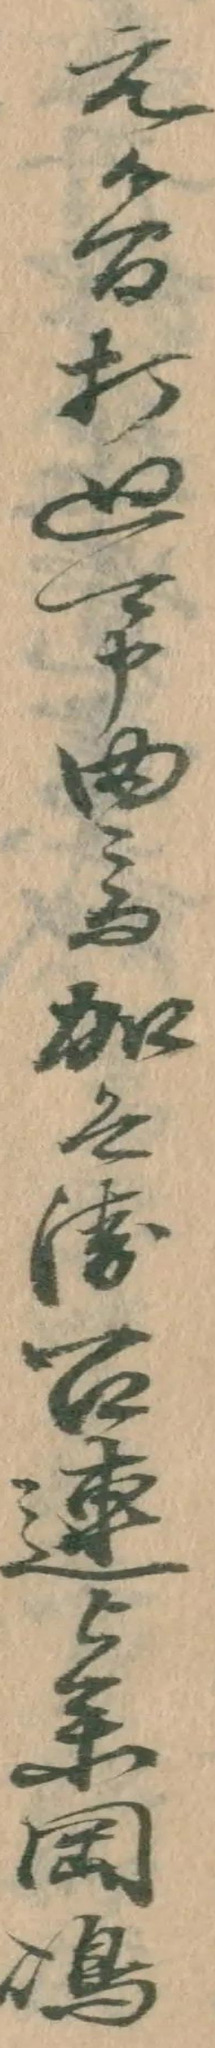元候間打廻可申由に而加兵衛召連被参岡島
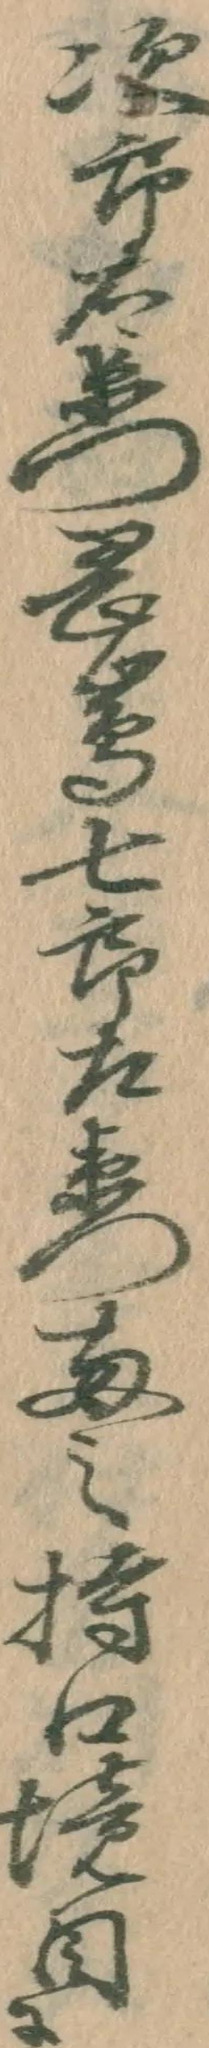次郎右衛門岡島七郎左衛門両之持口境目に
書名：切支丹御退治記 49巻. [3]
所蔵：国立国会図書館 National Diet Library, JAPAN
